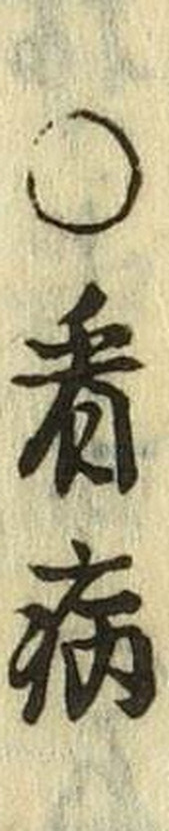○看病
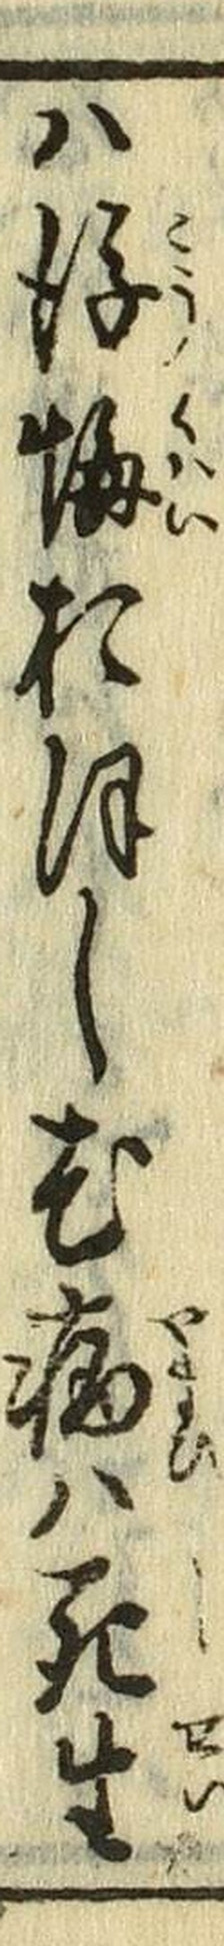は後悔おほし尤病は死生
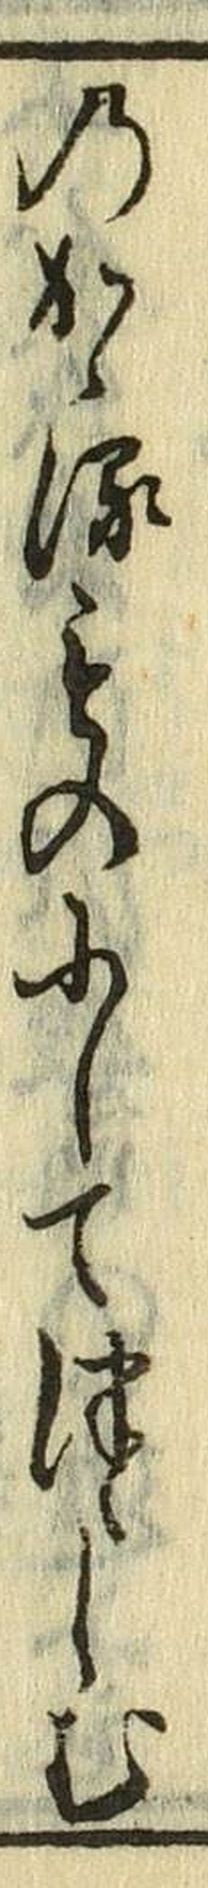のかゝるものにしてつゝしむ
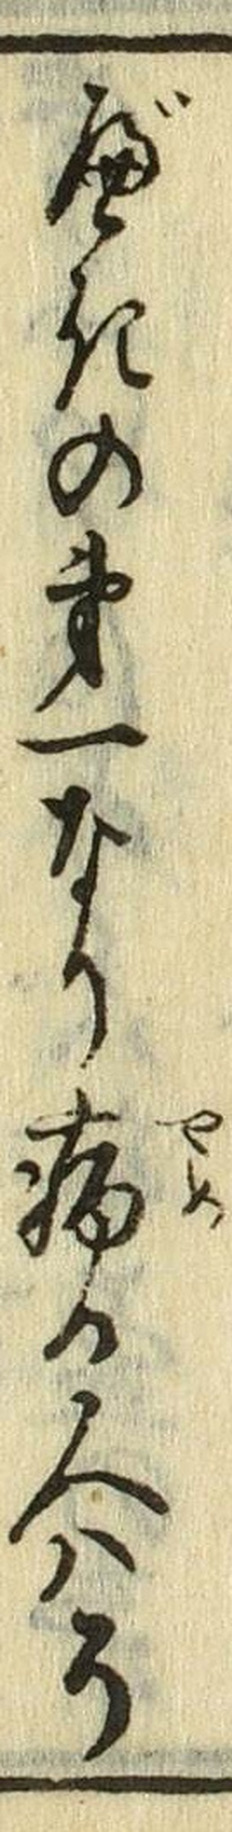べきの第一なり病る人はそ
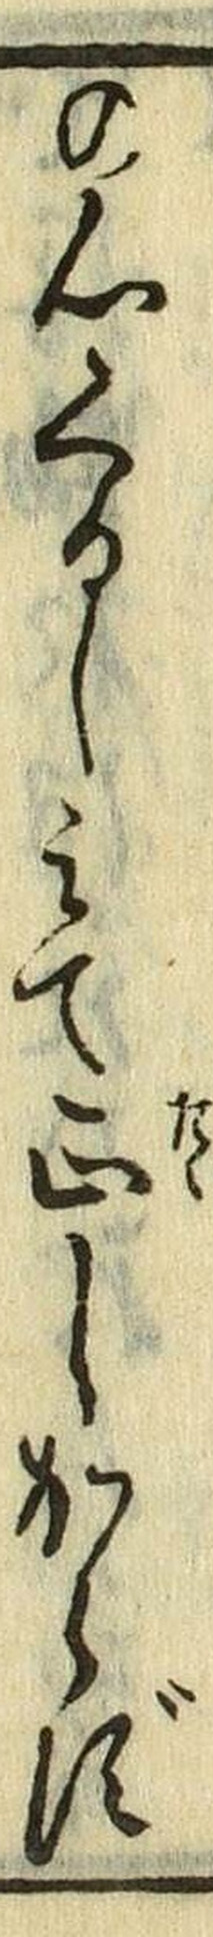の心くるしみて正しからず
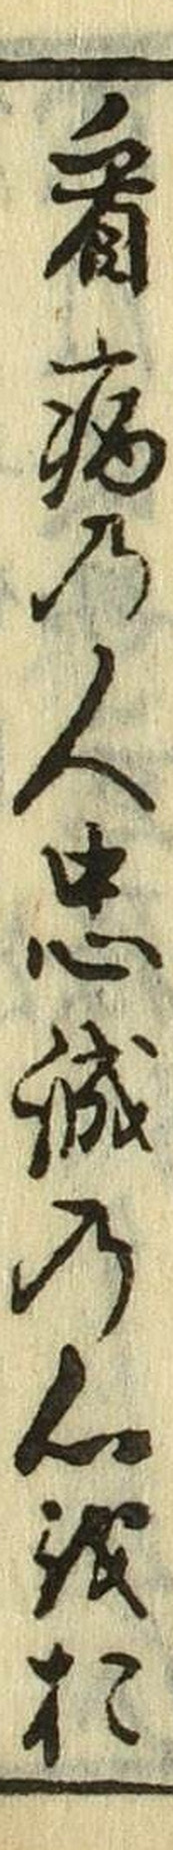看病の人忠誠の心をお
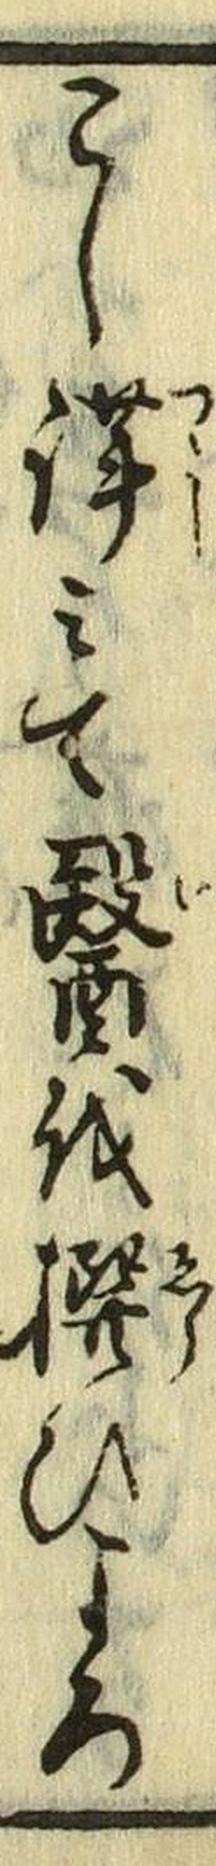こし謹みて医を撰ひよろ
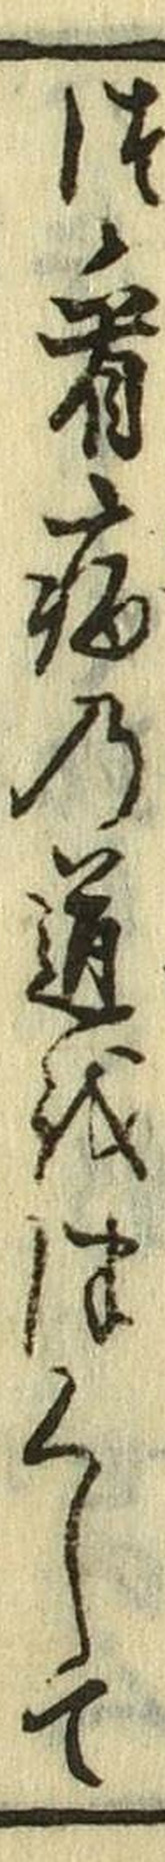づ看病の道をつくして
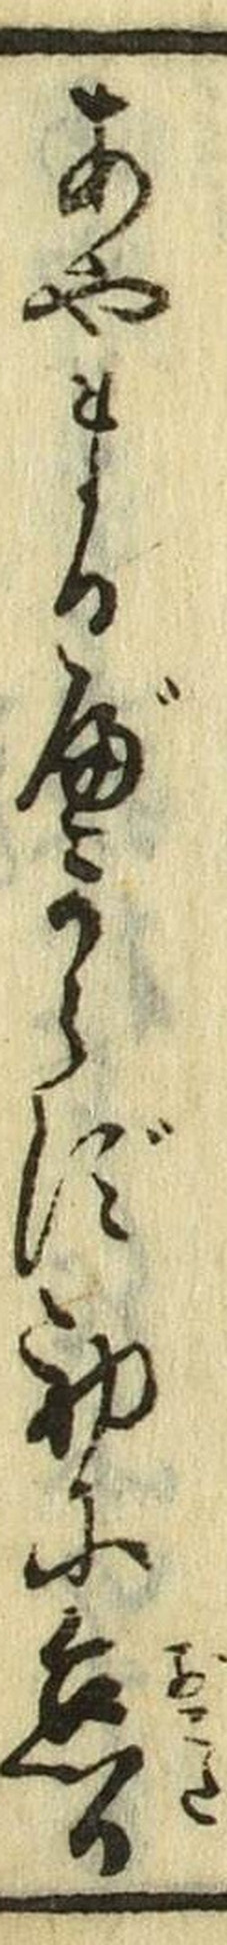あやまるべからず初に怠る

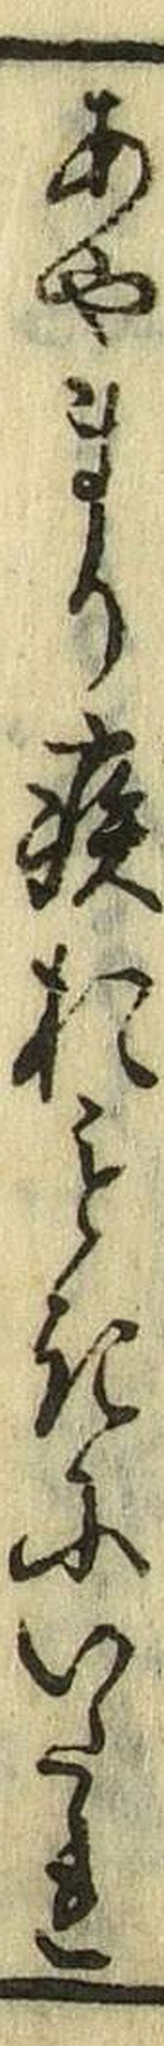あやまり疾おもきにいたれ
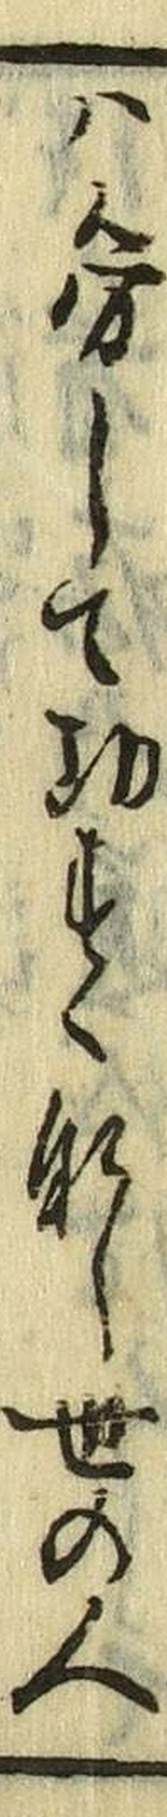ば労して功すくなし世の人
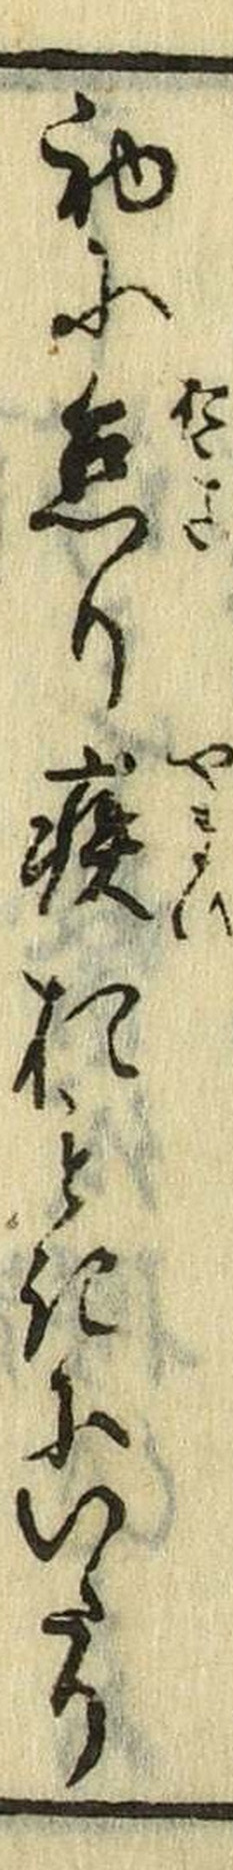初に怠り疾おもきにいたり
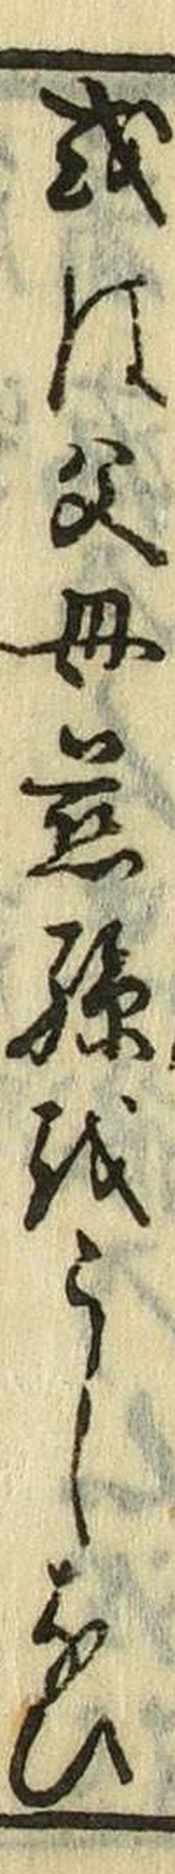或は父母慈孫をうしなひ
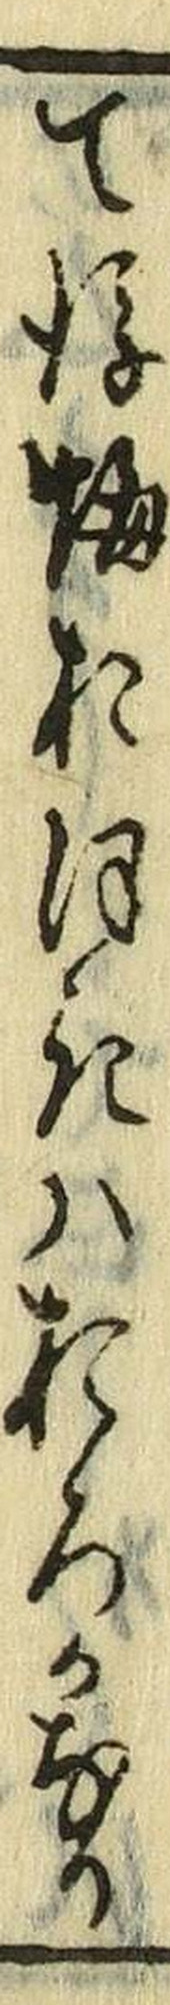て後悔おほきはおろかなり
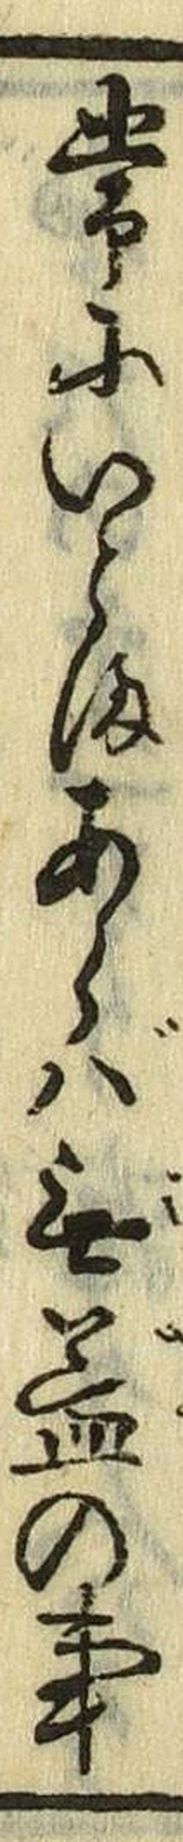常にいとまあらば無益の事
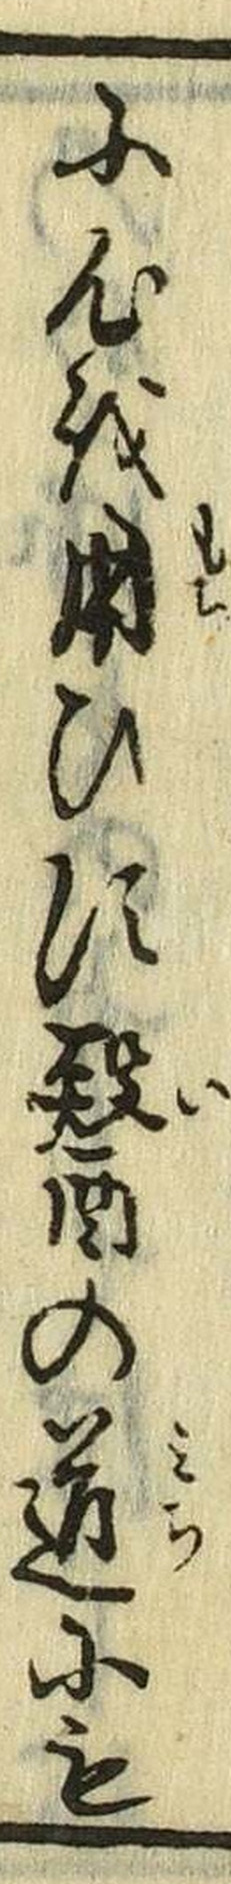に心を用ひす医の道にも
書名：居家養生記
